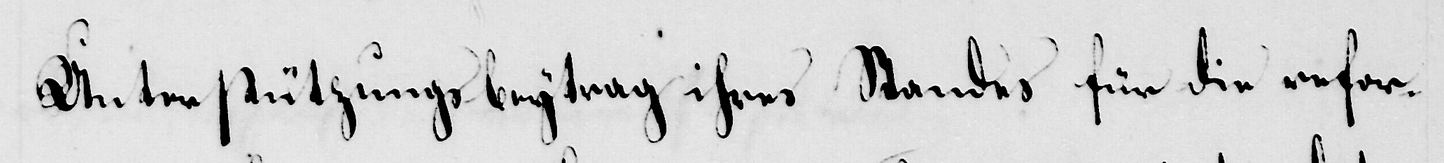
Unterstützungsbeytrag ihres Standes für die refor¬
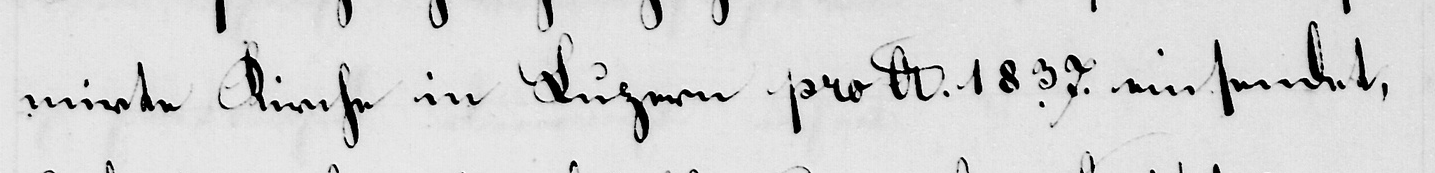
mirte Kirche in Luzern pro A. 1837. einsendet,
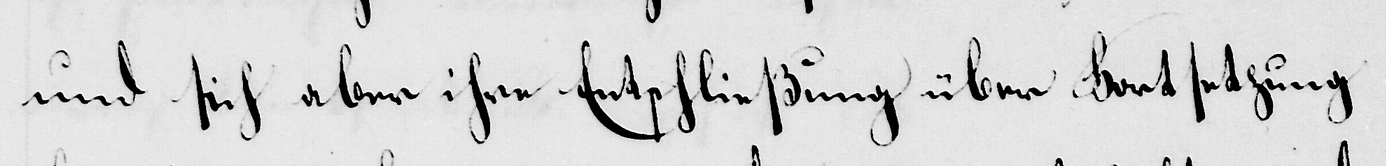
und sich aber ihre Entschließung über Fortsetzung
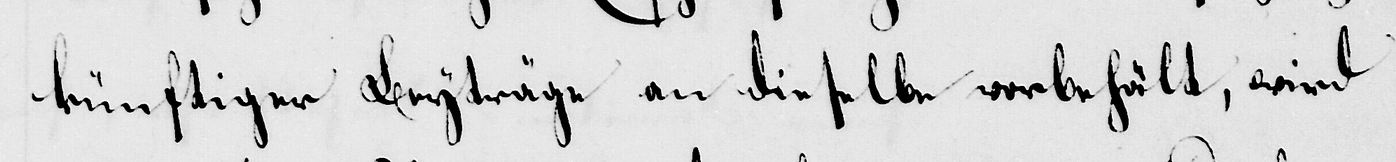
künftiger Beyträge an dieselbe vorbehält, wird
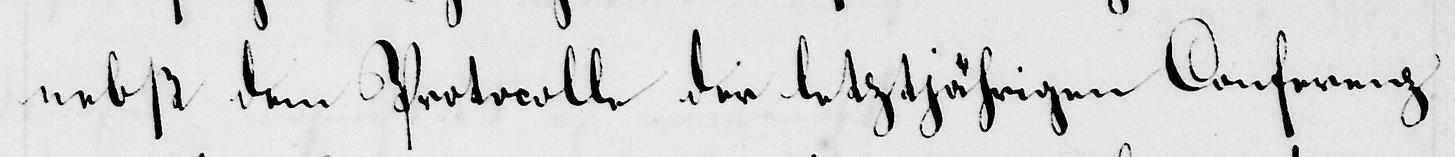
nebst dem Protocolle der letztjährigen Conferenz
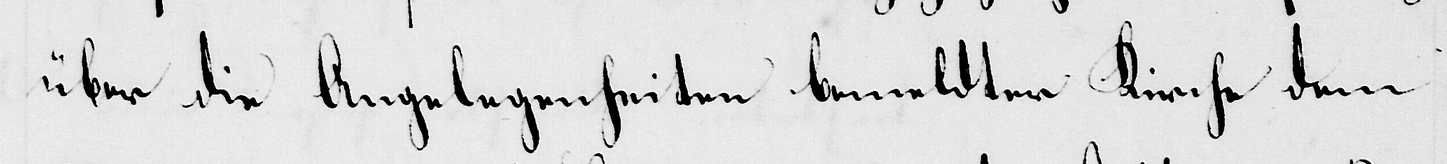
über die Angelegenheiten bemeldter Kirche dem
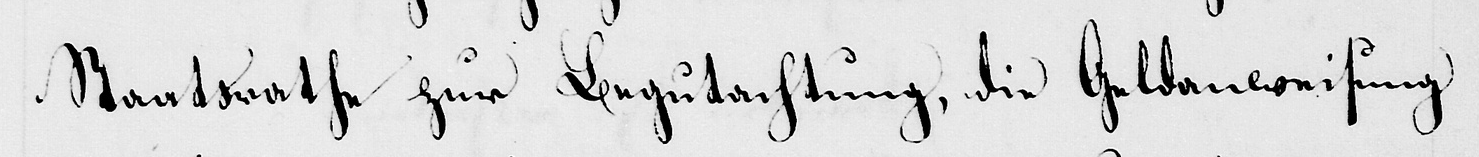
Staatsrathe zur Begutachtung, die Geldanweisung
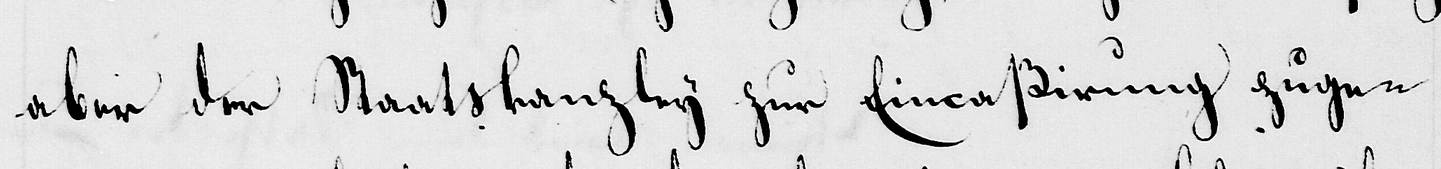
aber der Staatskanzley zur Eincaßirung zuge¬
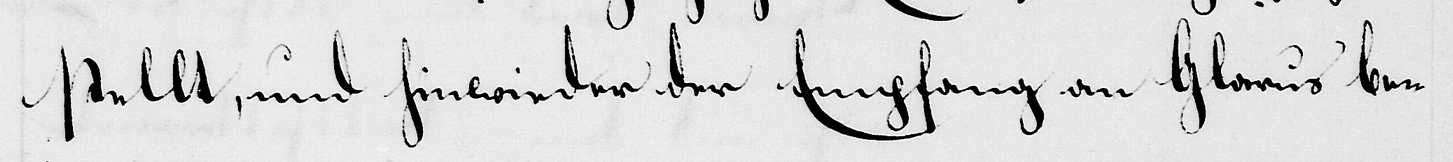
stellt, und hinwieder der Empfang an Glarus be¬
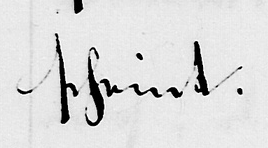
scheint.
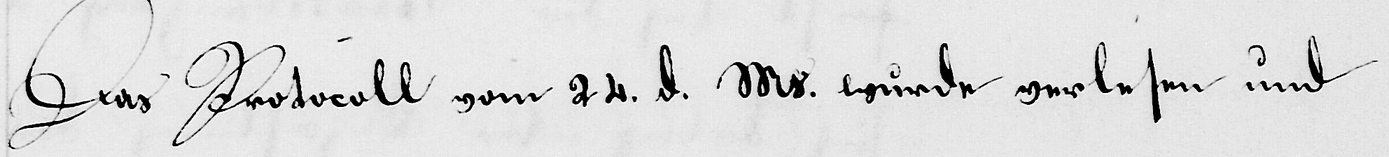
Das Protocoll vom 24. d. Ms. wurde verlesen und
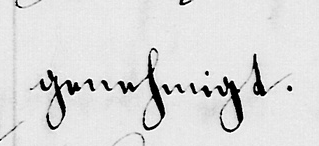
genehmigt.
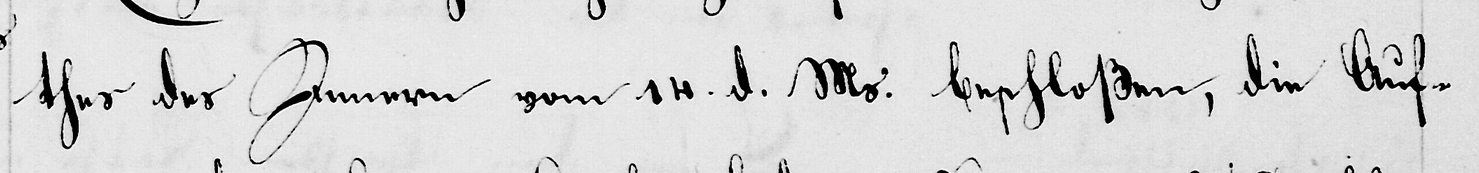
thes des Innern vom 14. d. Ms. beschloßen, die Auf¬
